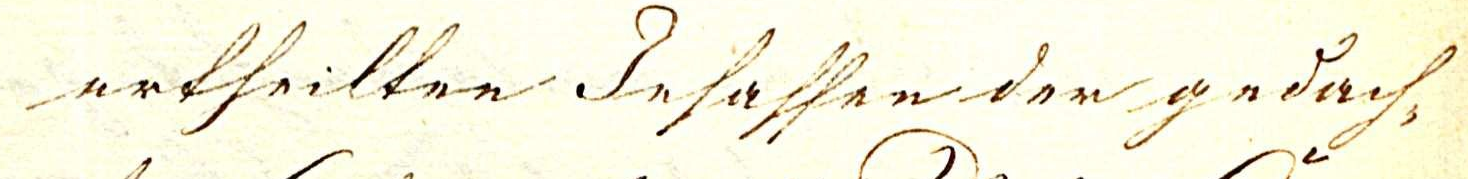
urtheilten Insassen der gedach¬
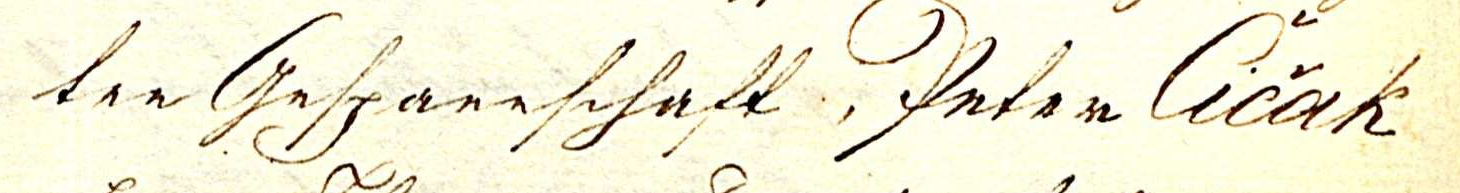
ten Gespannschaft, Peter Čičak
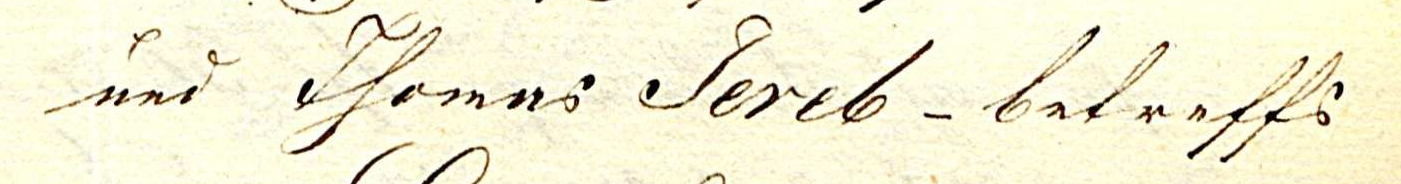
und Thomas Jereb – betreffs
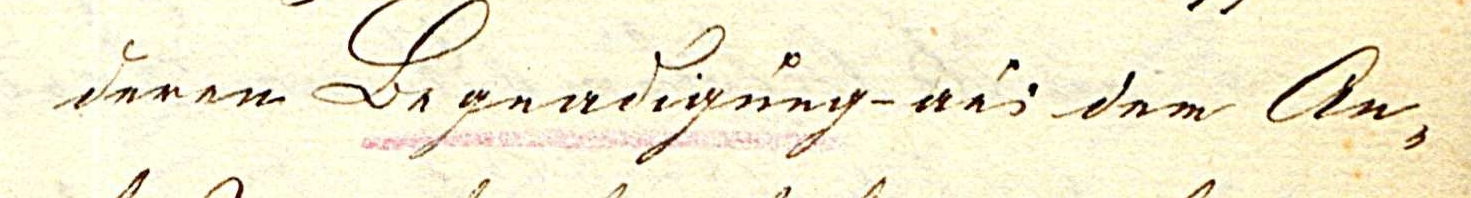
deren Begnadigung – aus dem An¬
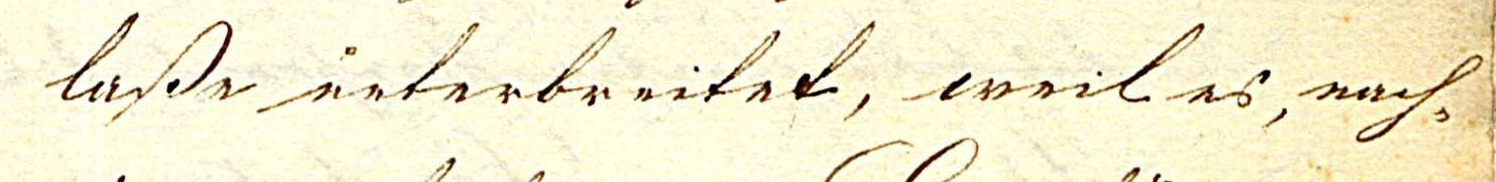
laße unterbreitet, weil es nach¬
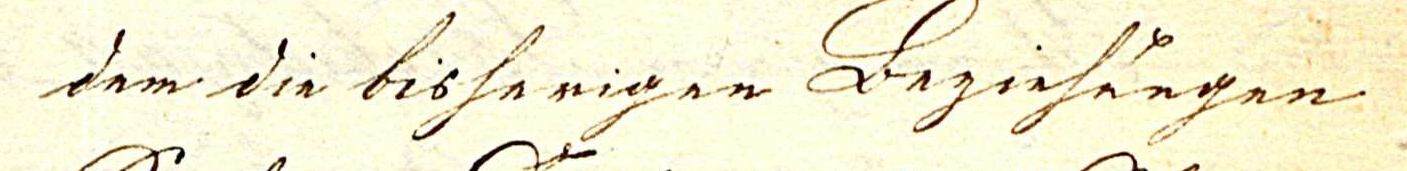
dem die bisherigen Beziehungen
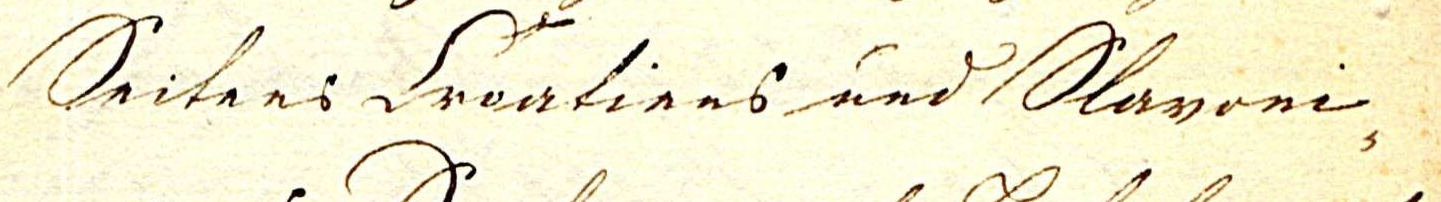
Seitens Croatiens und Slavoni¬
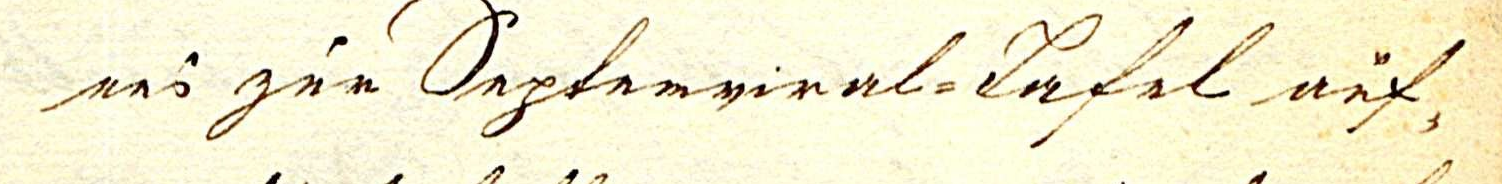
ens zur Septemviral-Tafel auf¬
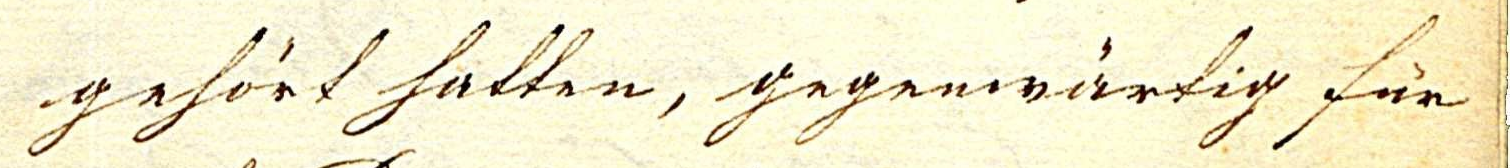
gehört hatten, gegenwärtig für
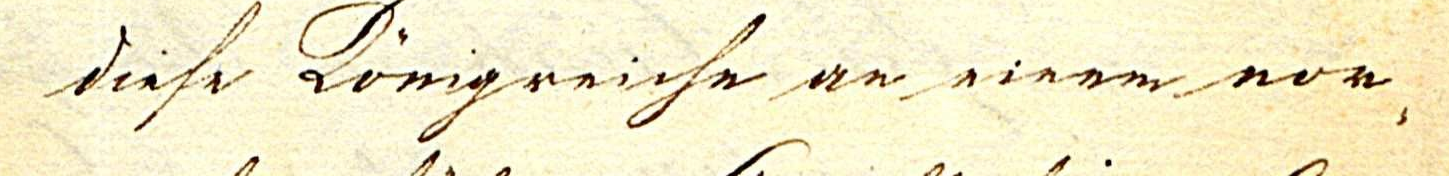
diese Königreiche an einem nor¬
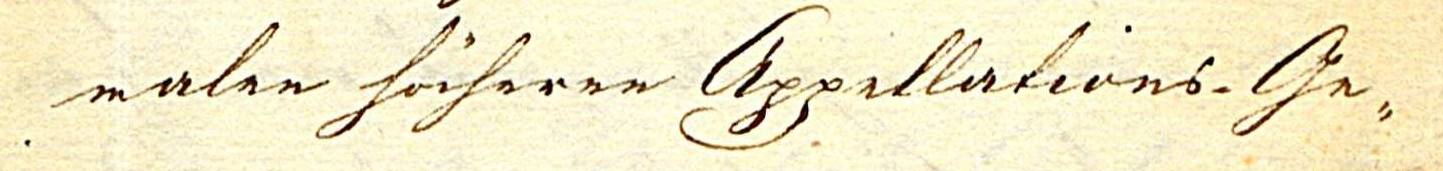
malen höheren Appellations-Ge¬
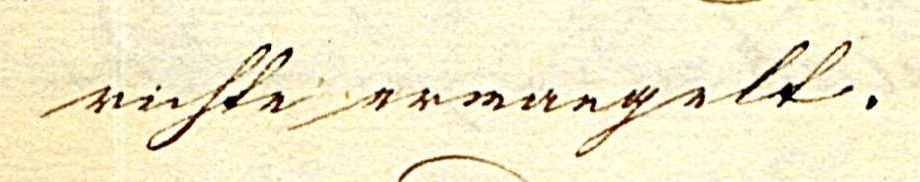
richte ermangelt.
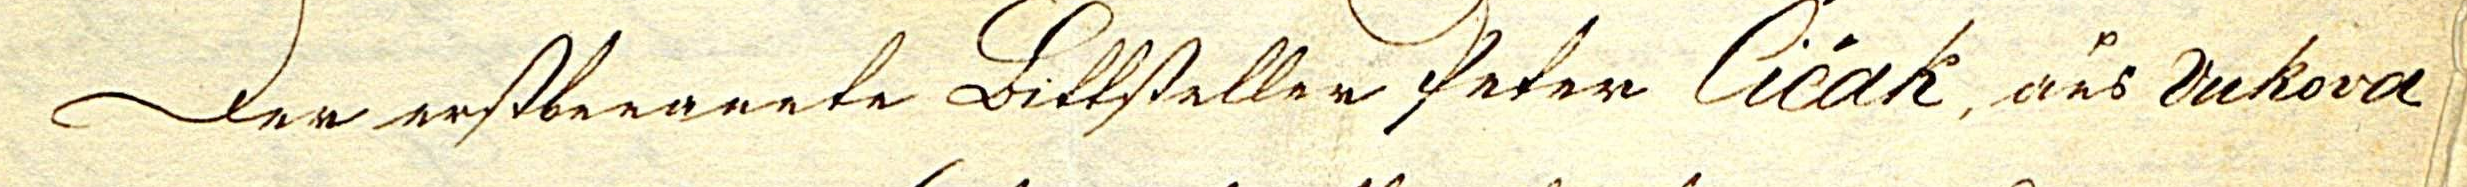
Der erstbenannte Bittsteller Peter Čičak aus Vukova
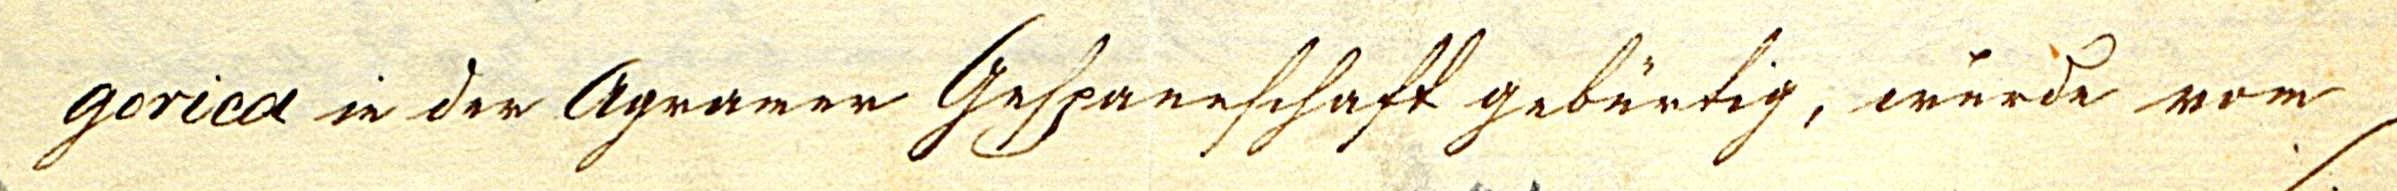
gorica in der Agramer Gespannschaft gebürtig, wurde vom
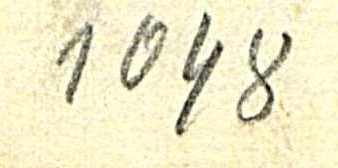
1048
